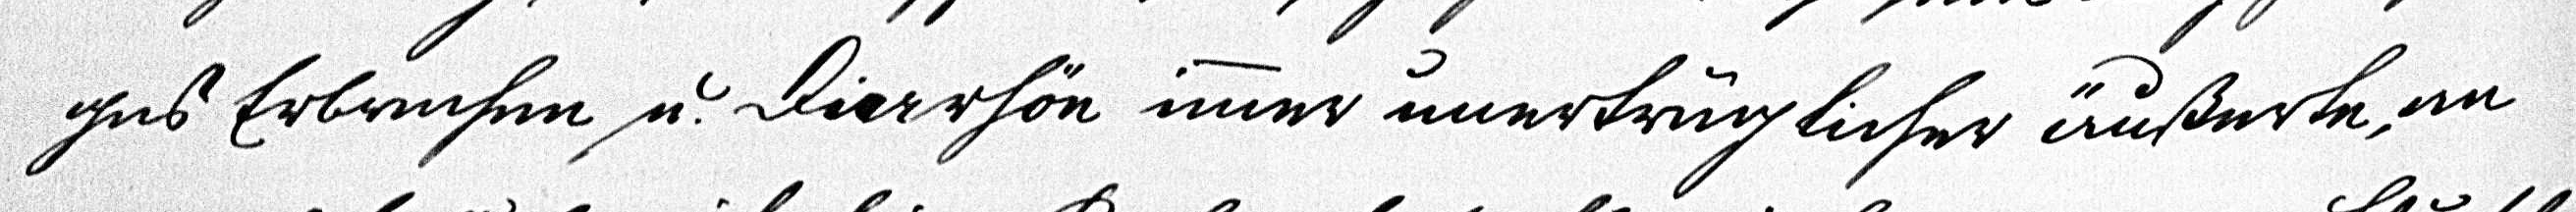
ges Erbrechen u. Dierrhöe immer unerträglicher äußerte, an
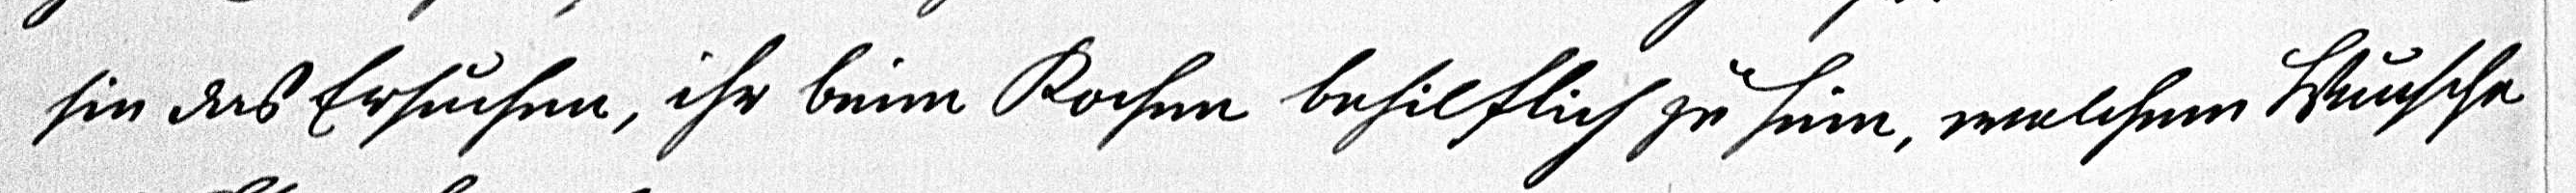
sie das Ersuchen, ihr beim Kochen behilflich zu sein, welchem Wunsche
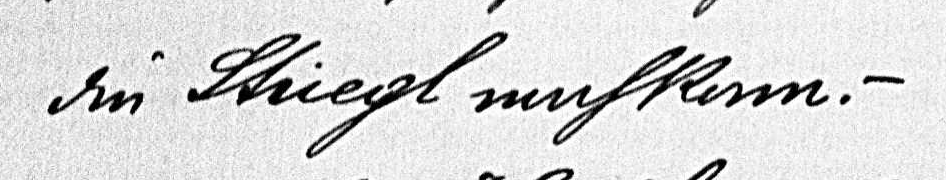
die Striegl nachkam.
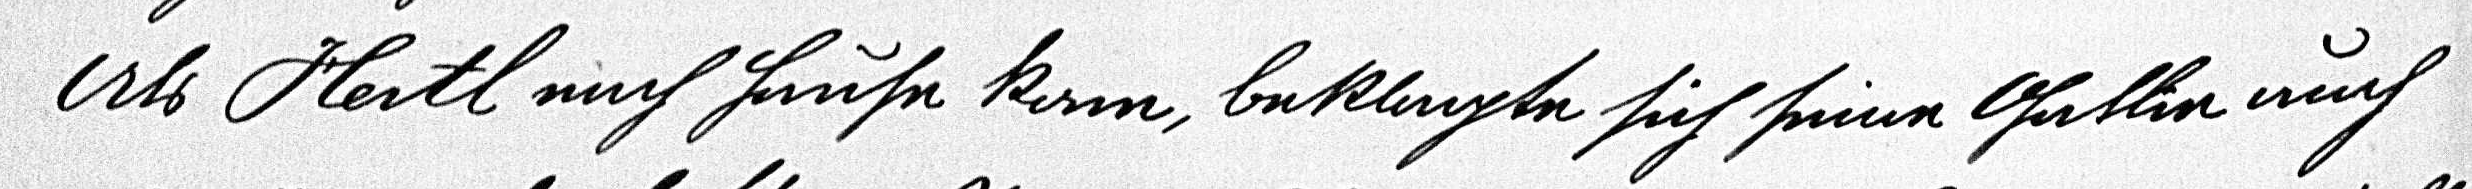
Als Hertl nach Hause kam, beklagte sich seine Gattin auch
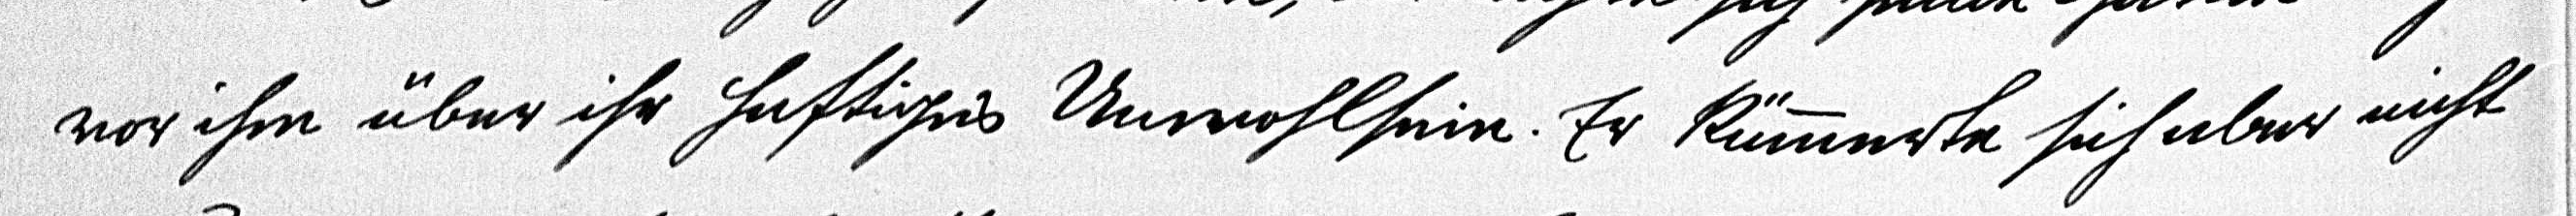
vor ihm über ihr heftiges Unwollsein. Er kümmerte sich aber nicht
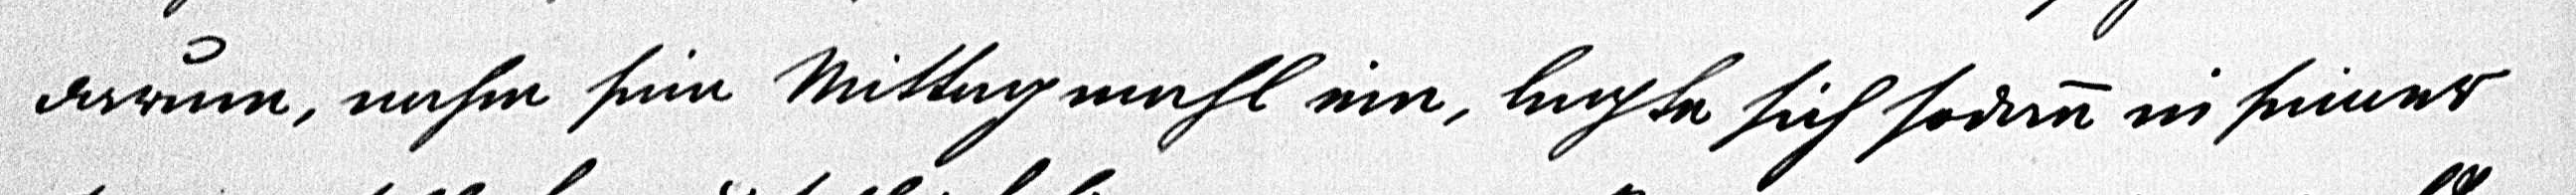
darum, nahm sein Mittag mahl ein, legte sich sodann in seiner
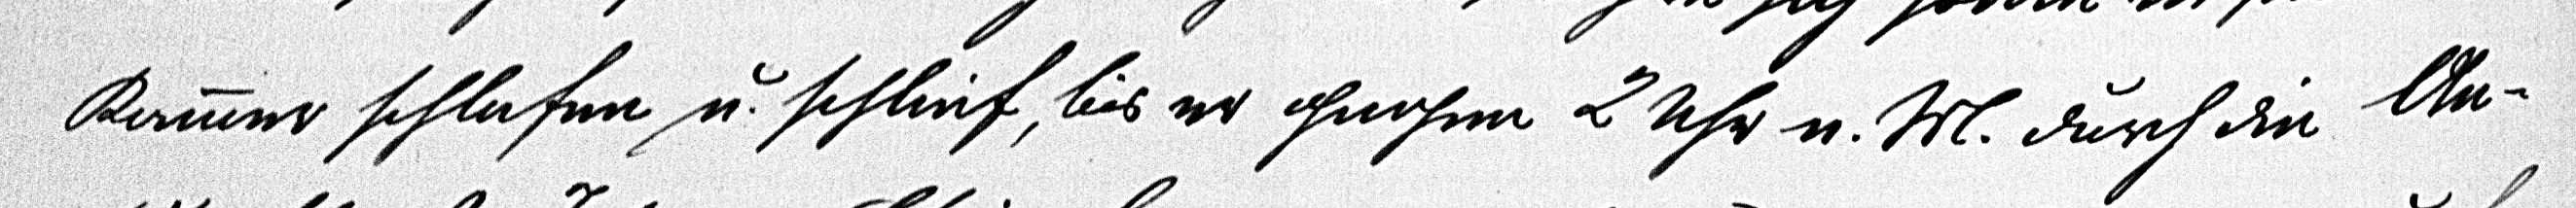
Kammer schlafen u. schlief, bis er gegen 2 Uhr n. M. durch die An¬
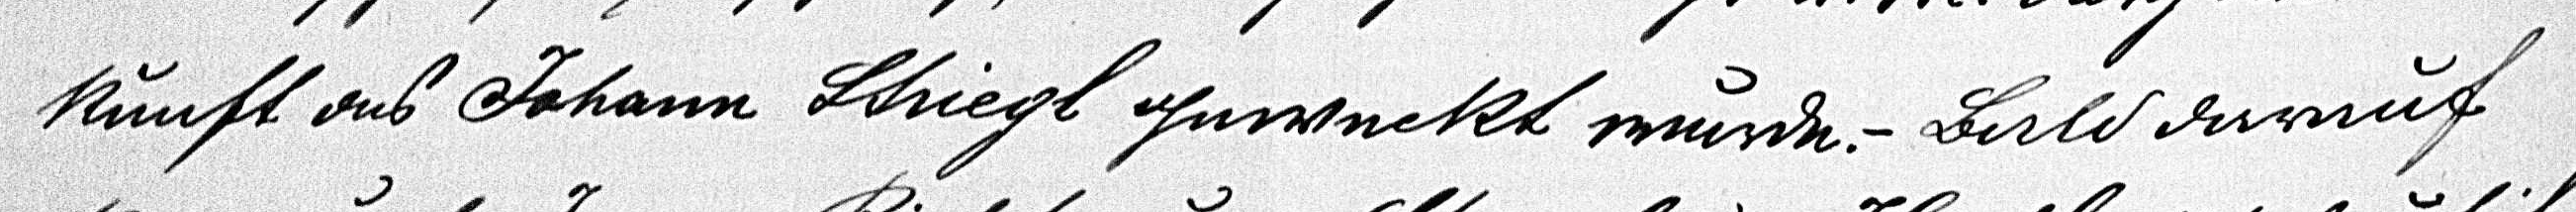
kunft des Johann Striegl geweckt wurde. Bald darauf
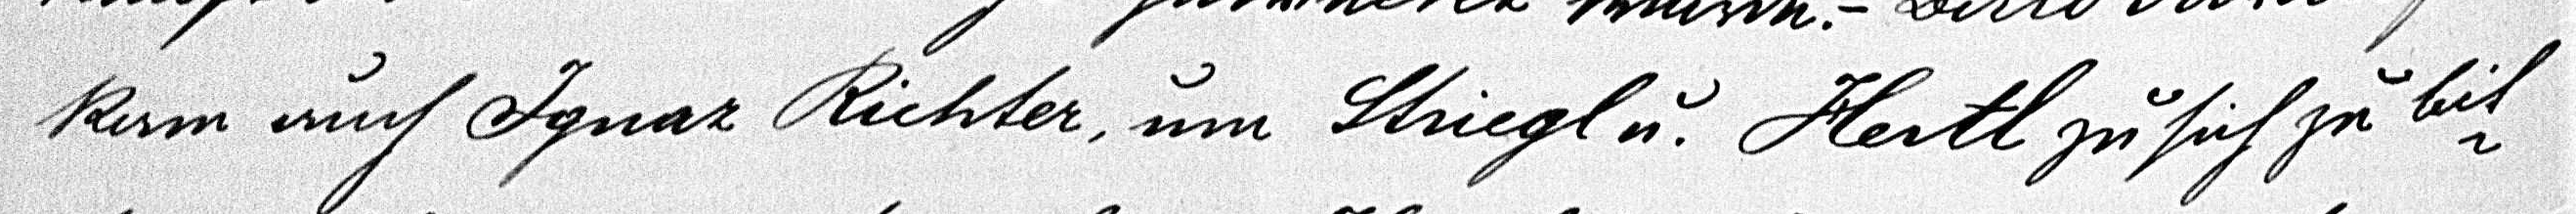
kam auch Ignaz Richter, um Striegl u. Hertl zu sich zu bit¬
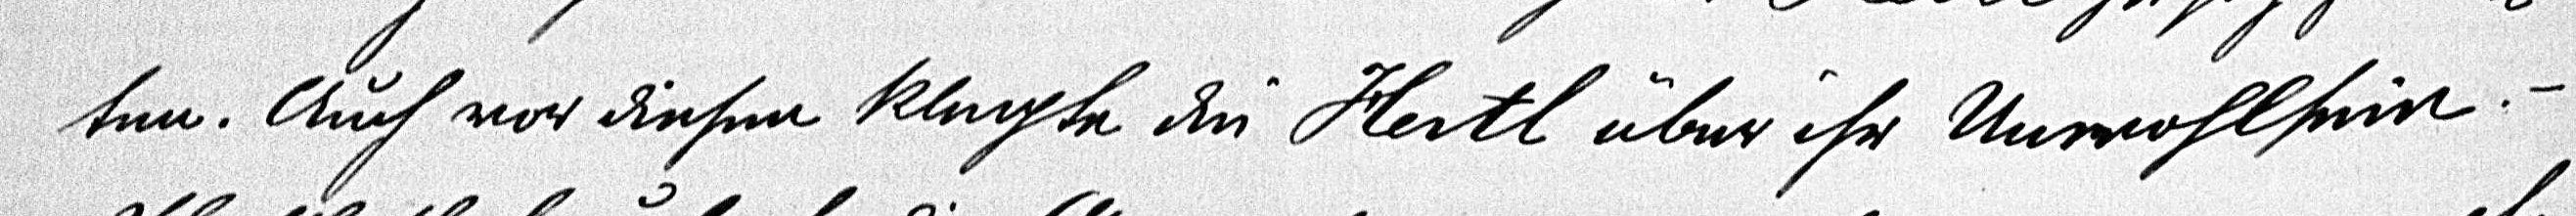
ten. Auch vor diesen klagte die Hertl über ihr Unwollsein.
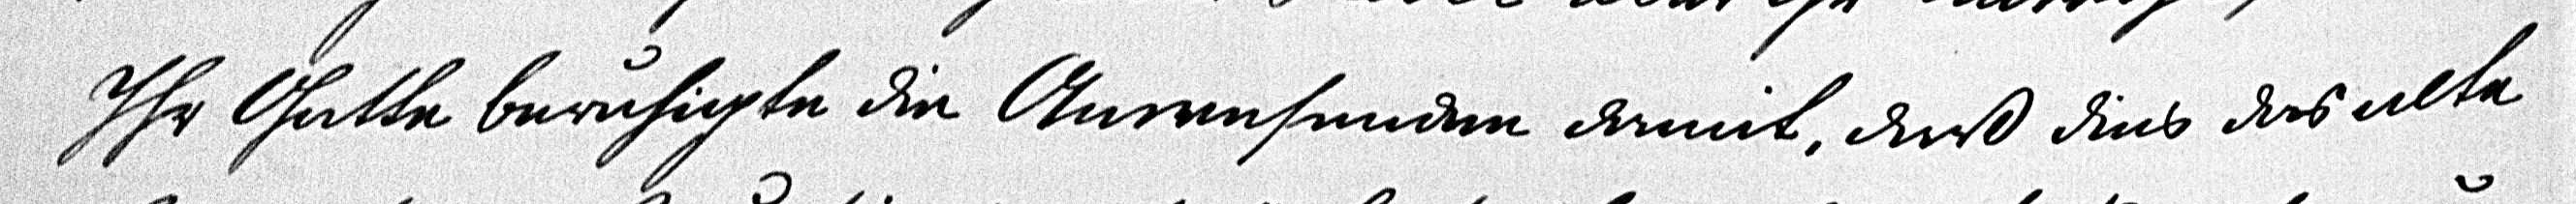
Ihr Gatte beruhigte die Anwesenden damit, das dies des alte
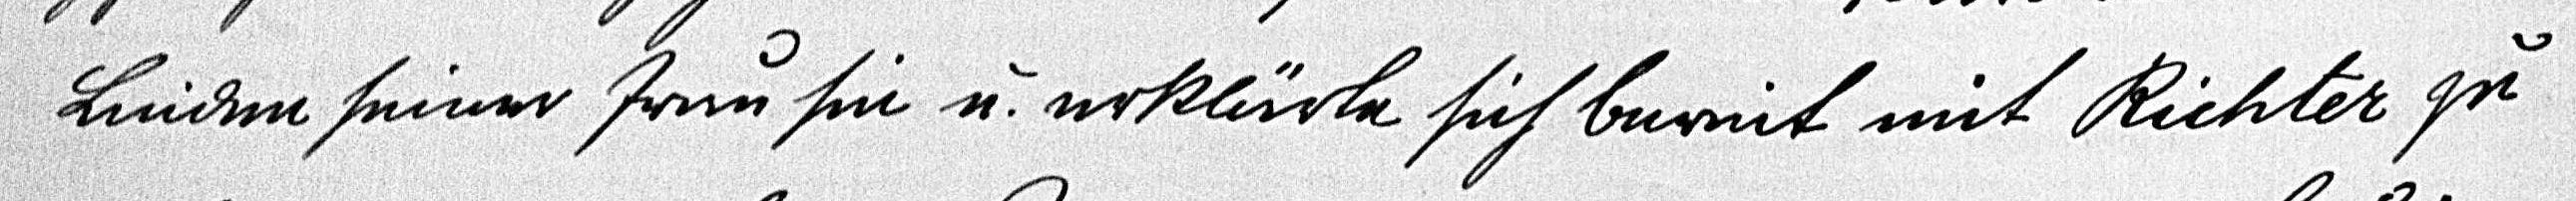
Leiden seiner Frau sei u. erklärte sich bereit mit Richter zu
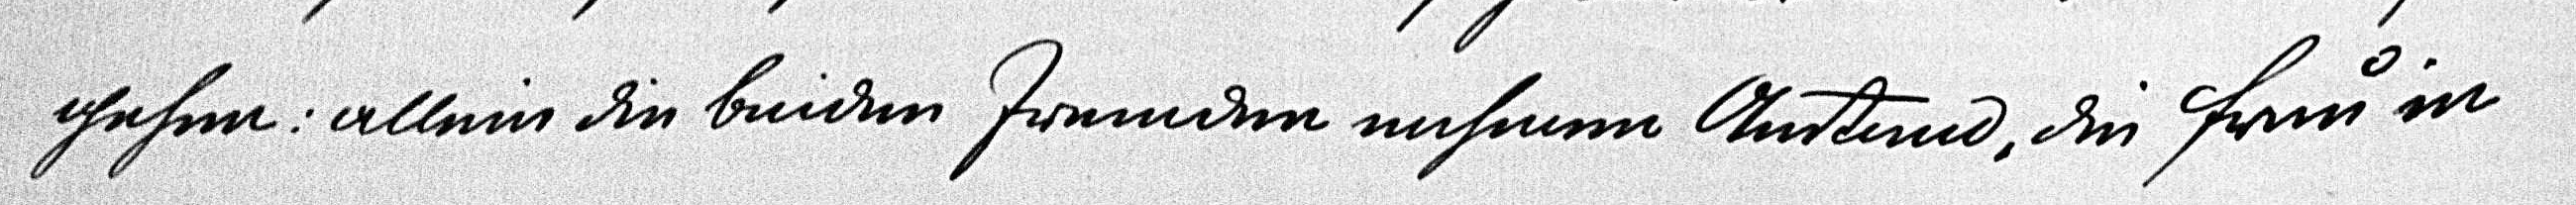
gehen: allein die beiden Fremden nahmen Anstand, die Frau in
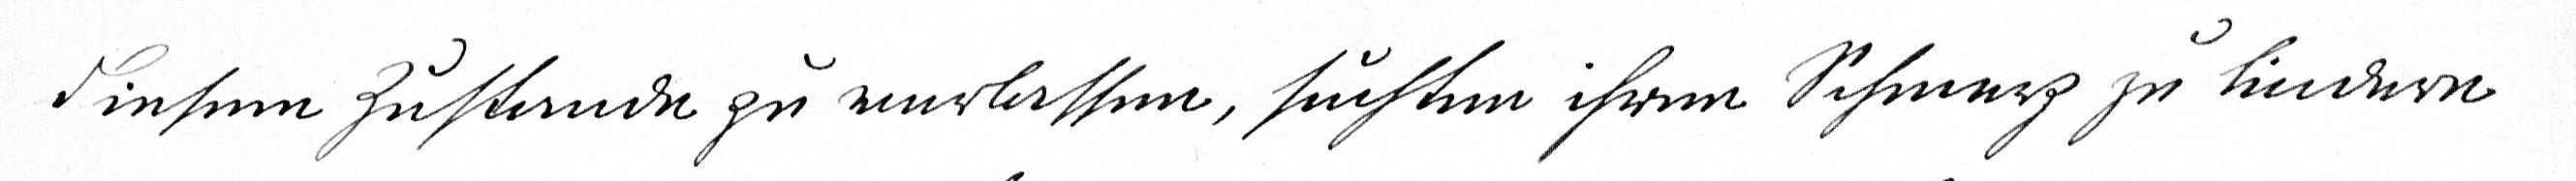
diesem Zustande zu verlassen, suchten ihren Schmerz zu lindern
